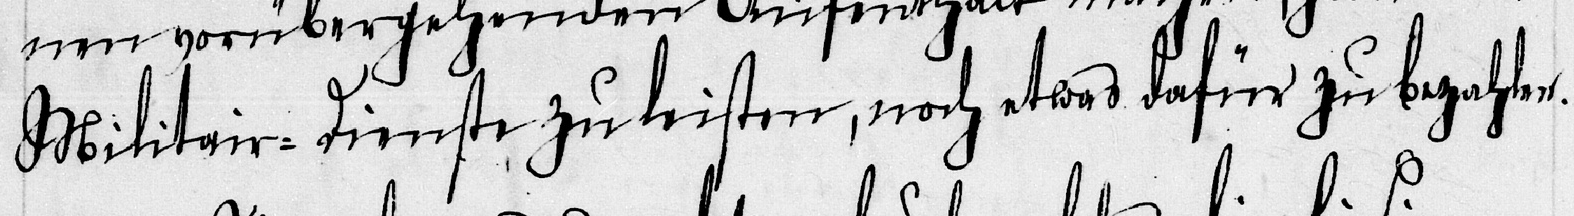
Militair-Dienste zu leisten, noch etwas dafür zu bezahlen.
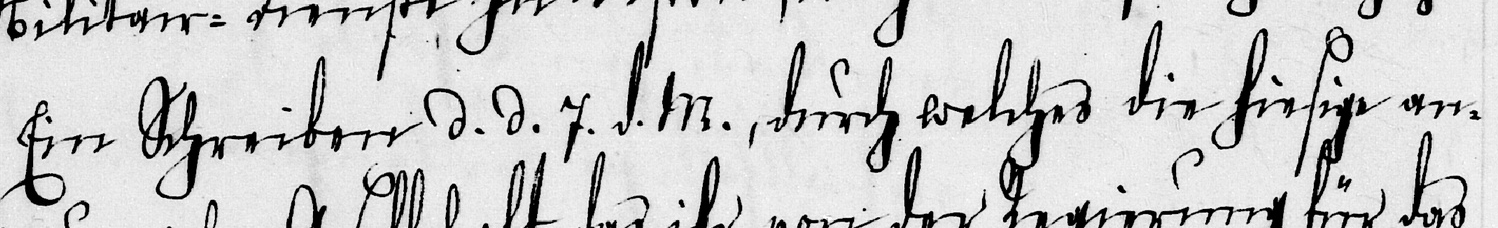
Ein Schreiben d. d. 7. d. M., durch welches die hiesige an¬
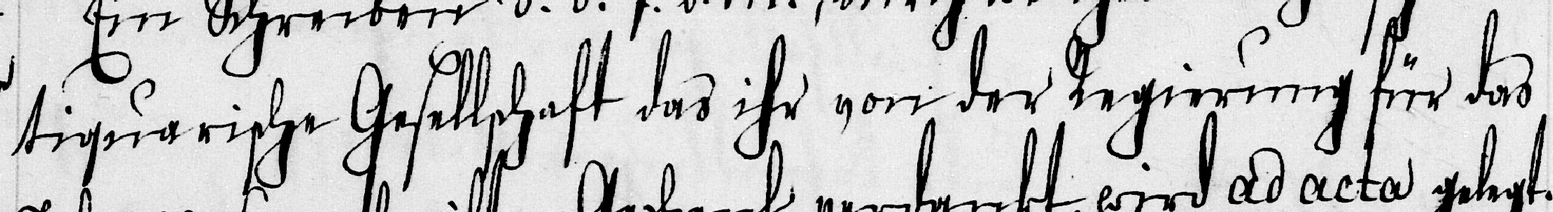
tiquarische Gesellschaft das ihr von der Regierung für das
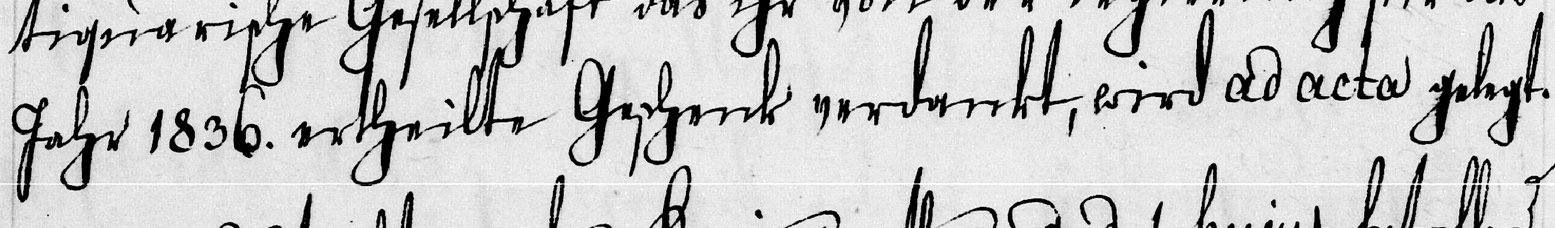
Jahr 1836. ertheilte Geschenk verdankt, wird ad acta gelegt.
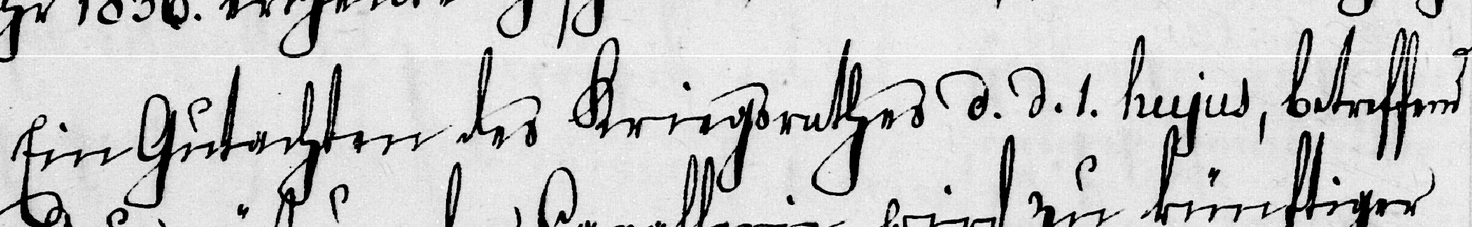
Ein Gutachten des Kriegsrathes d. d. 1. hujus, betreff¬
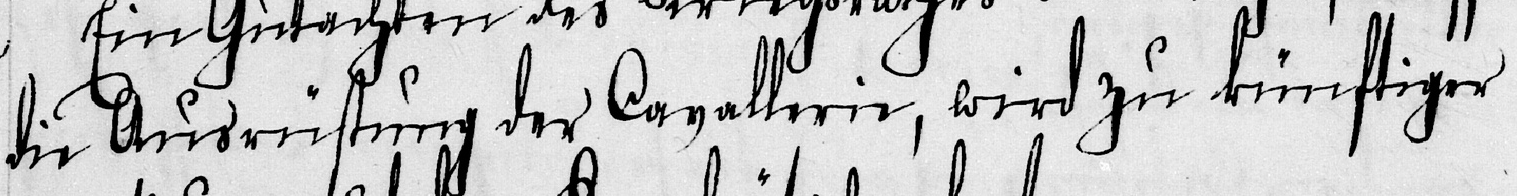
die Ausrüstung der Cavallerie, wird zu künftiger
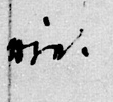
glie¬
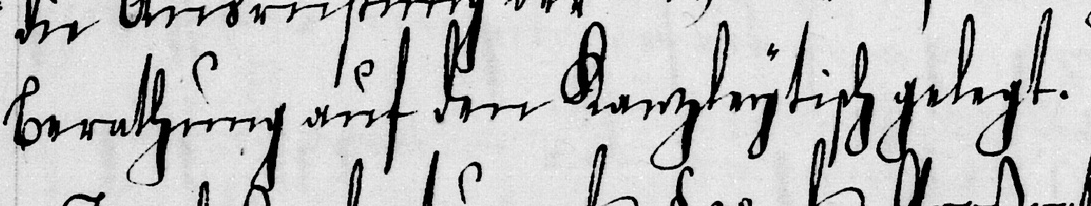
Berathung auf den Kanzleytisch gelegt.
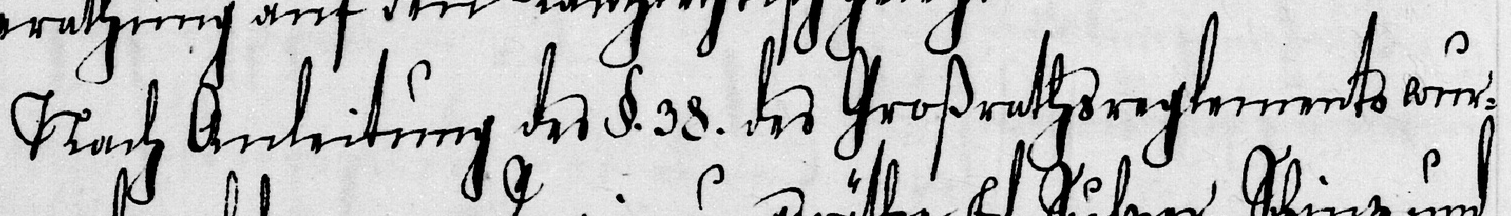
Nach Anleitung des §. 38. des Großrathsreglements wur¬
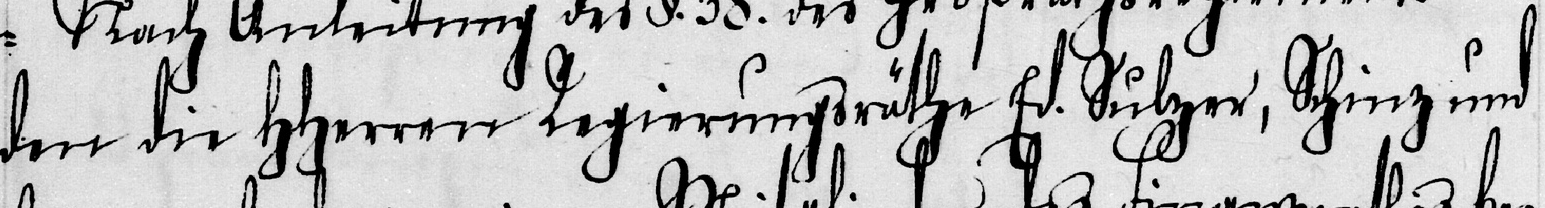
den die HHerren Regierungsräthe Ed. Sulzer, Schinz und
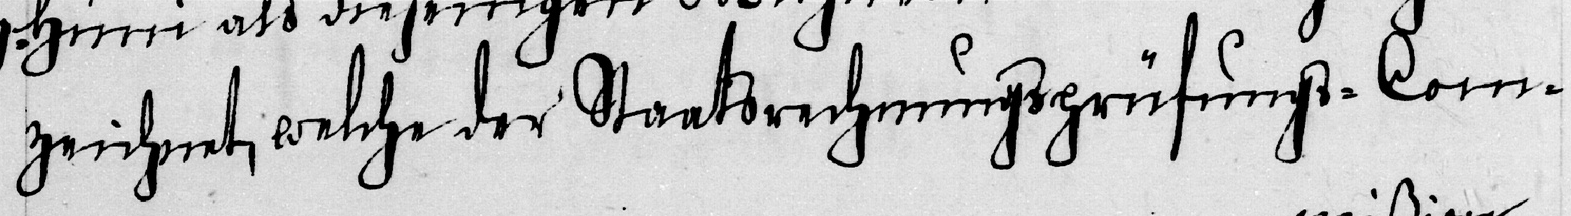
zeichnet, welche der Staatsrechnungsprüfungs-Com-
